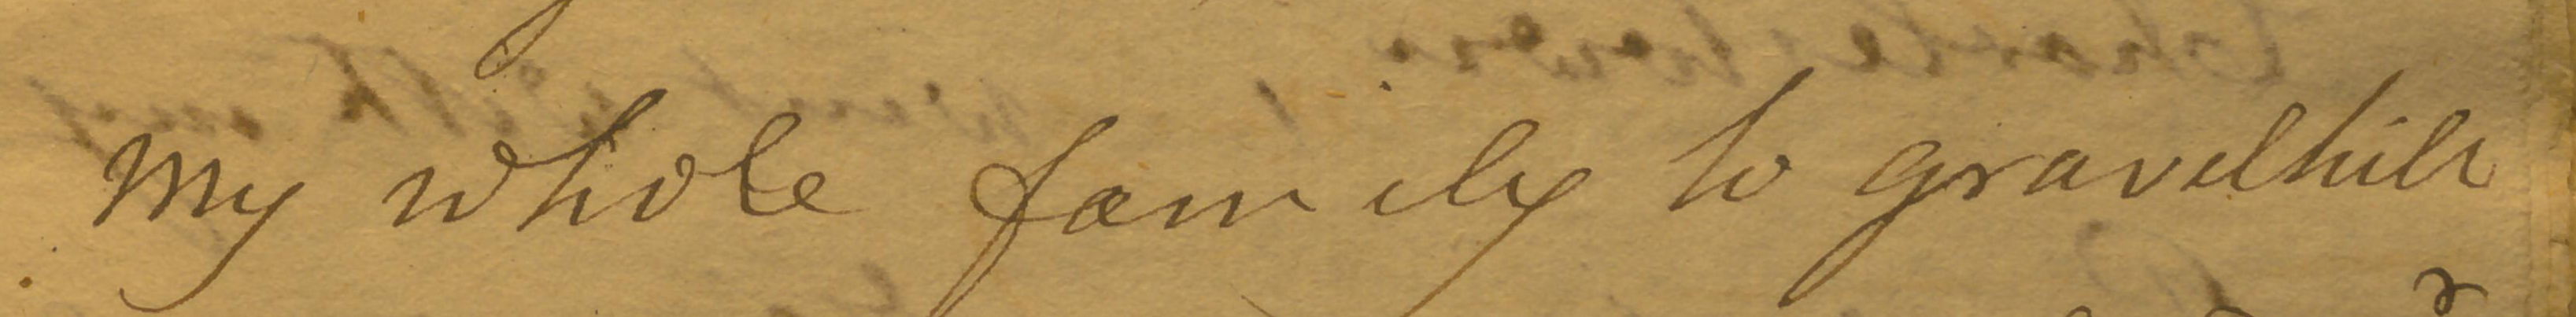My whole family to gravelhill
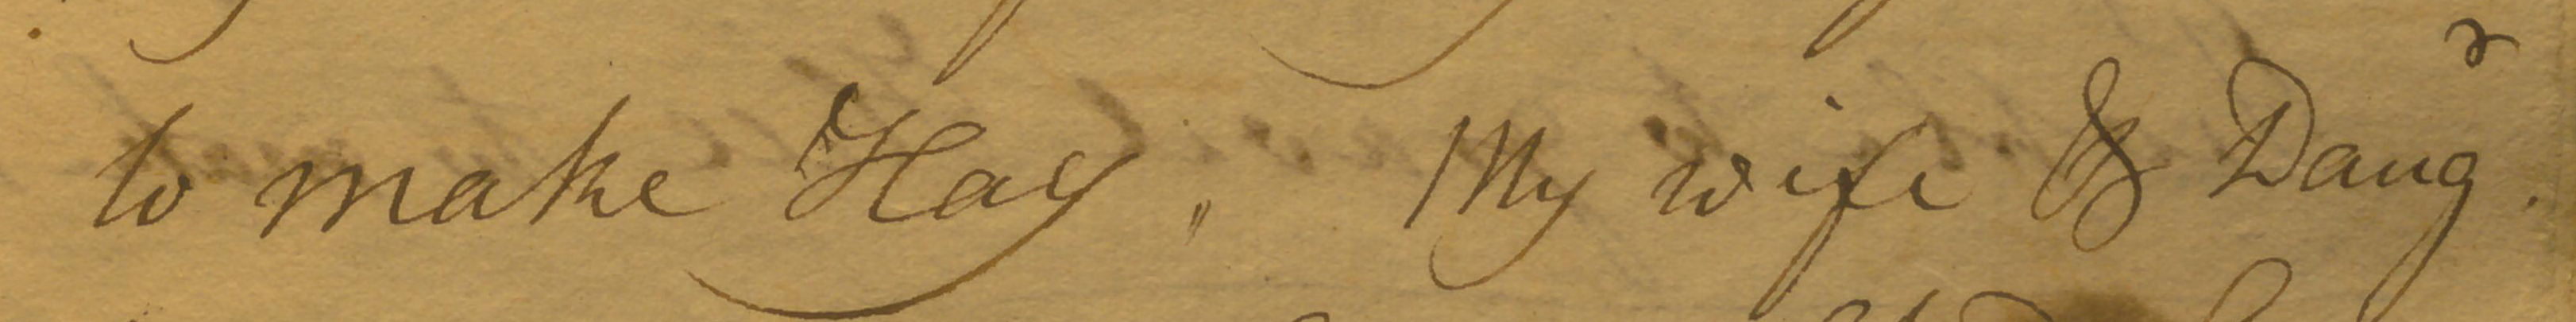to make Hay. My wife & Daug^r.
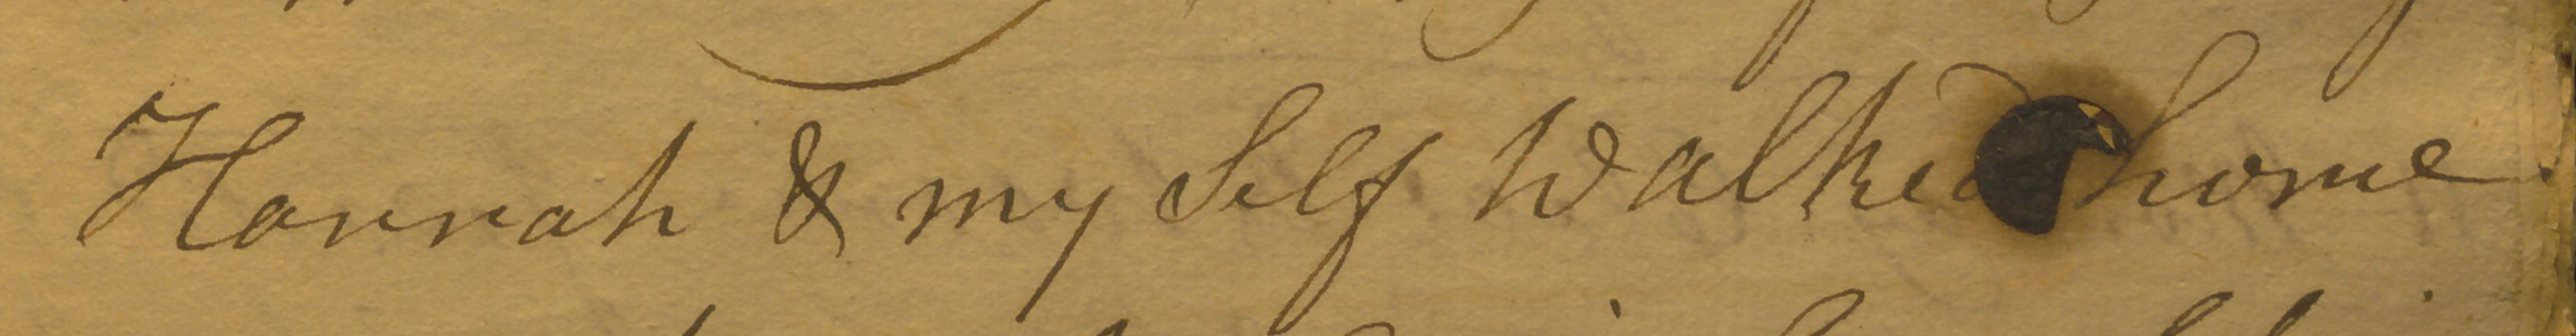Hannah & my self Walked home
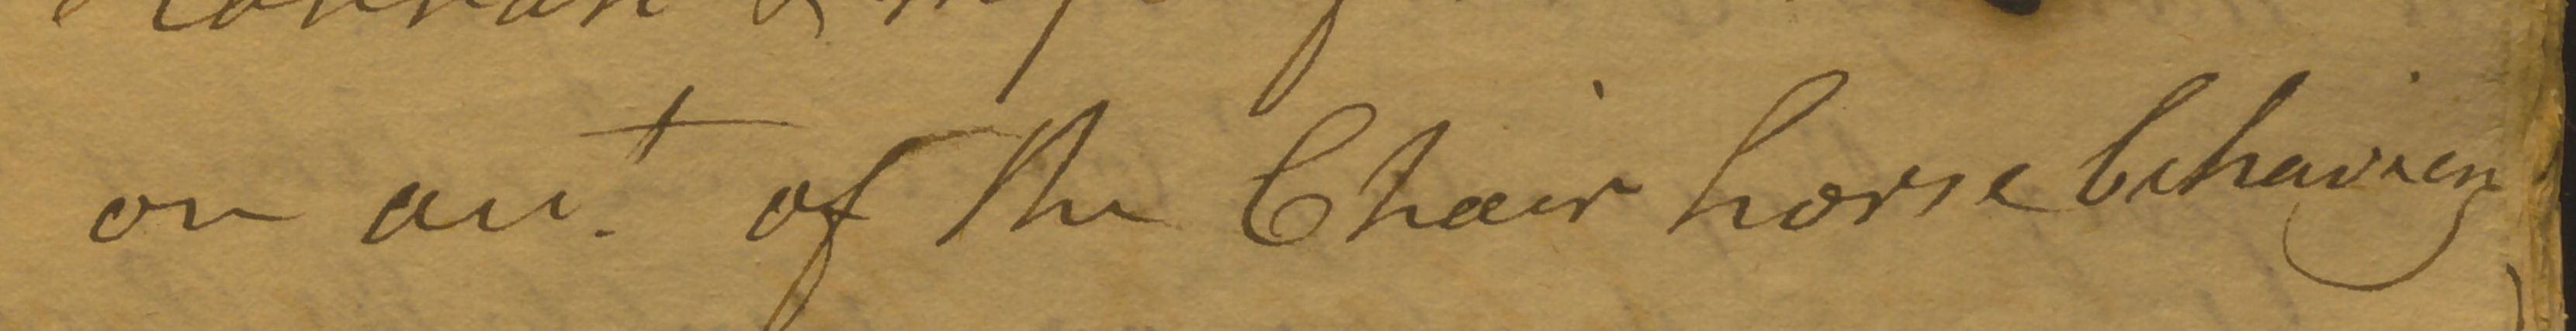on acc^t. of the Chair horse behaving
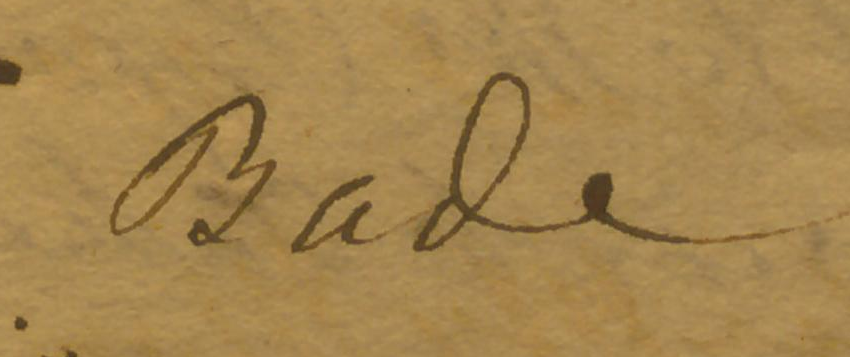Bade
